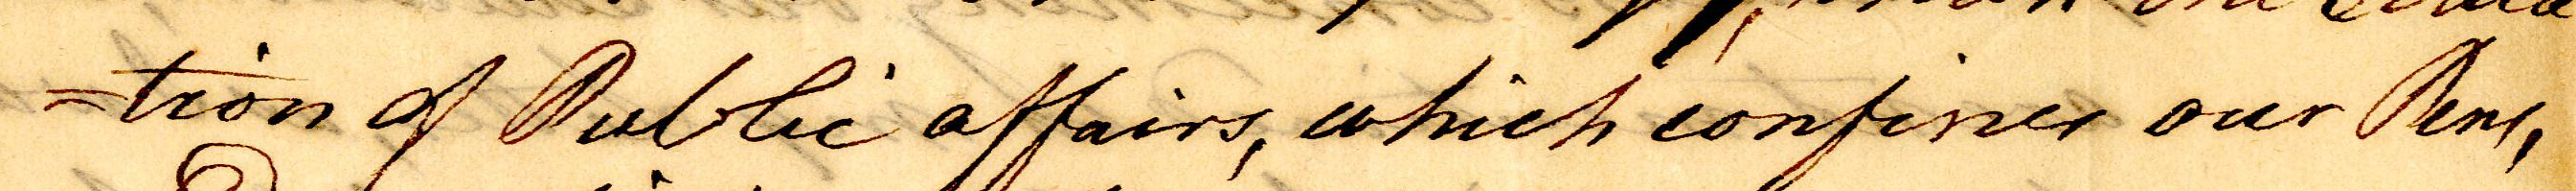-tion of Public affairs, which confines our Pens,
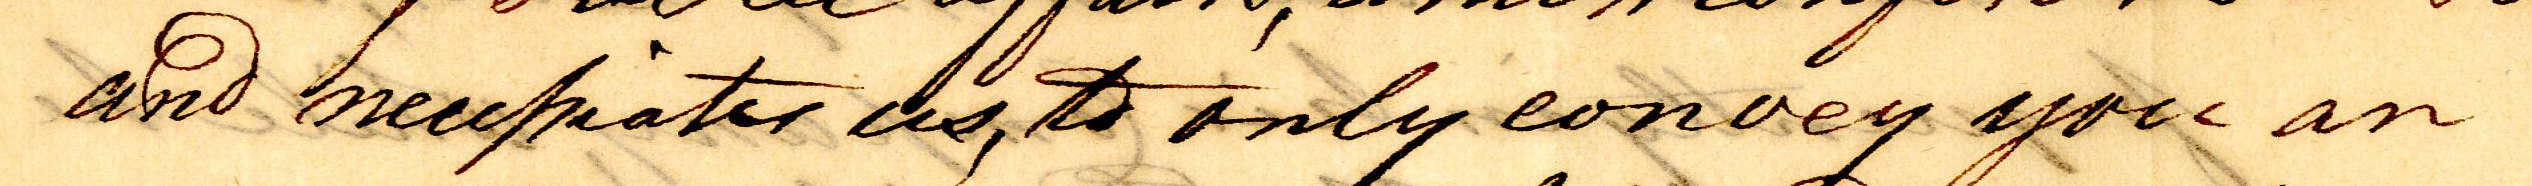and necessitates us, to only convey you an
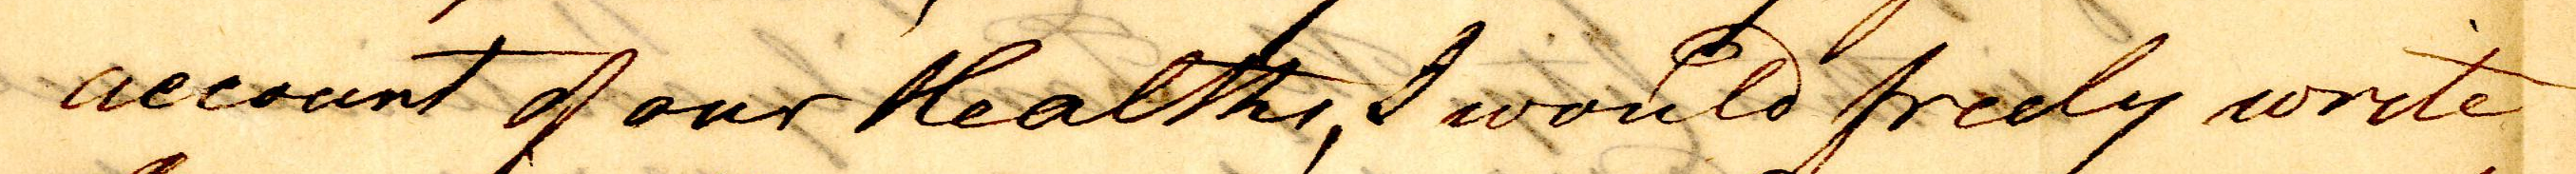account of our Health, I would freely write
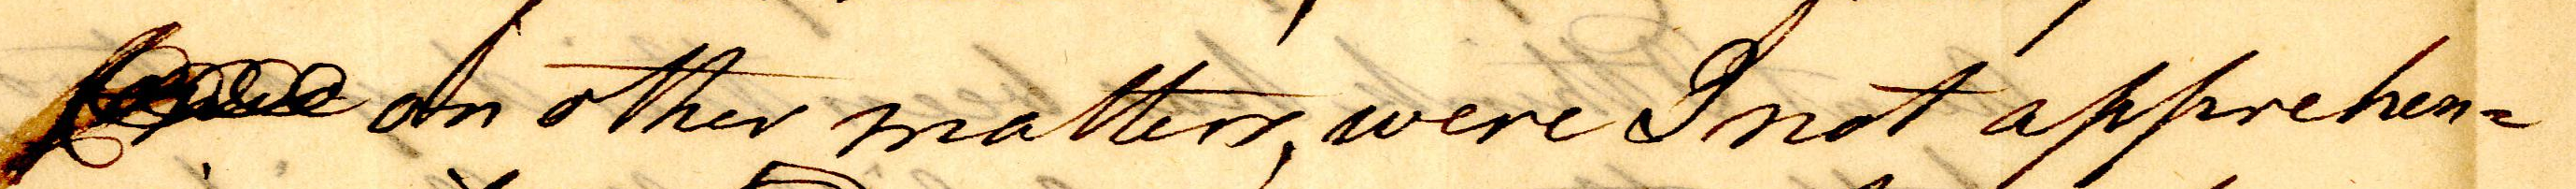on other matters, were I not apprehen-
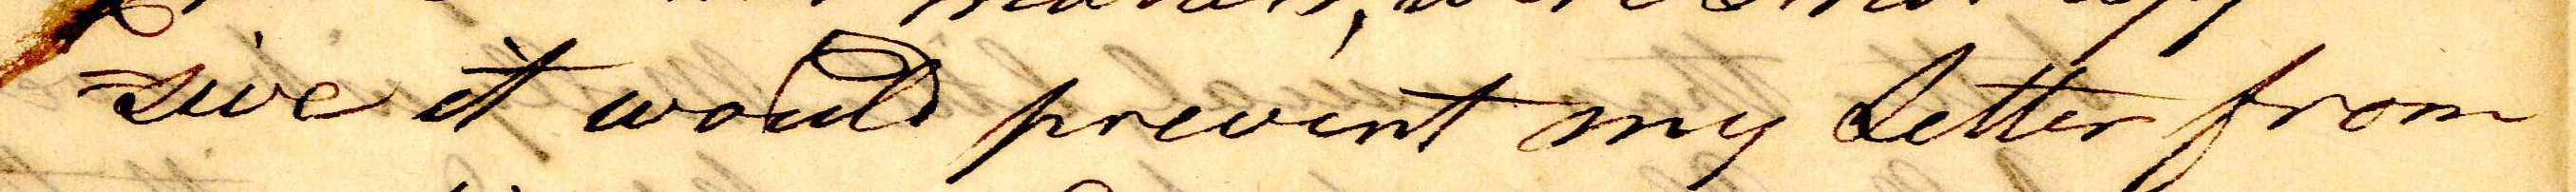-sive it would prevent my Letter from
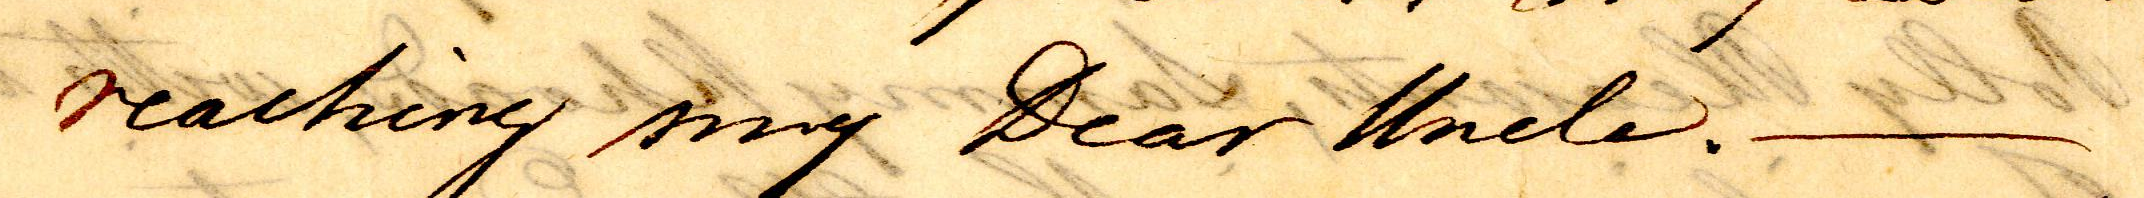reaching my Dear Uncle.-
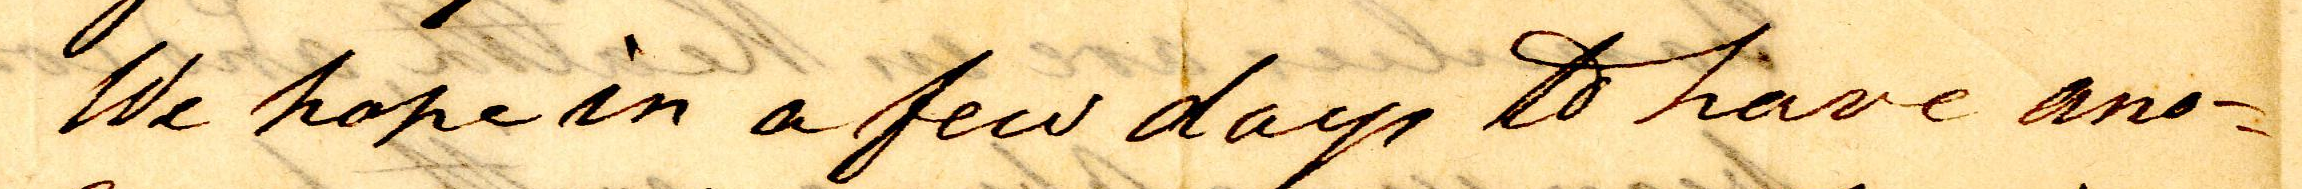We hope in a few days to have ano-
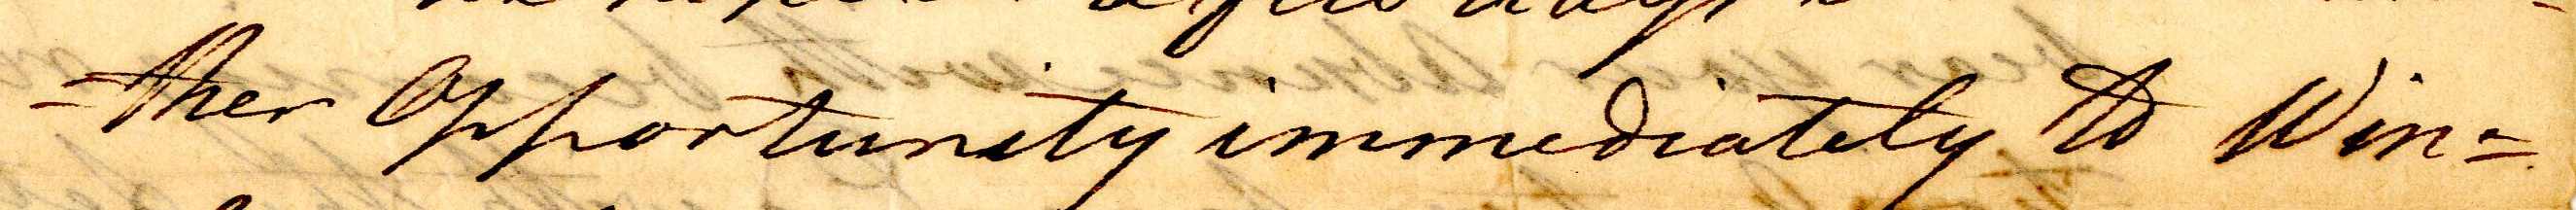-ther Opportunity immediately to Win-
